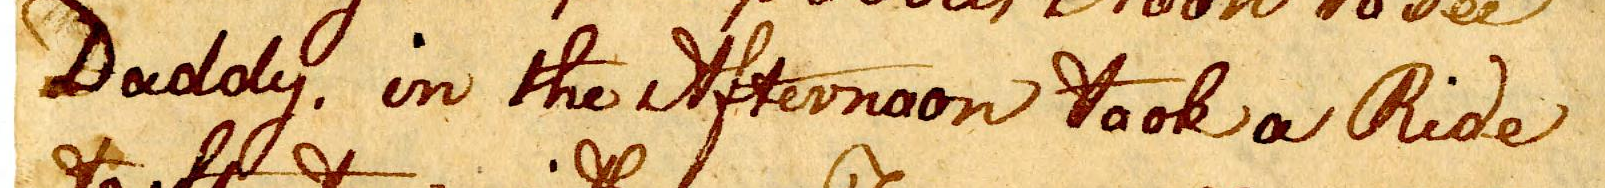Daddy. in the Afternoon took a Ride
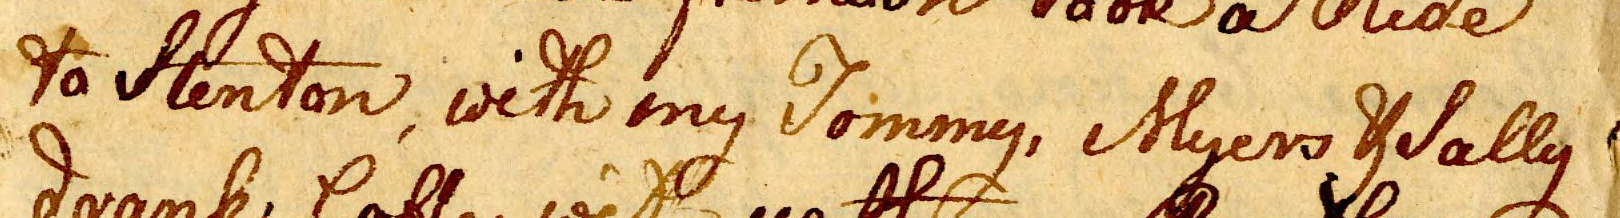to Stenton, with my Tommy, Myers & Sally
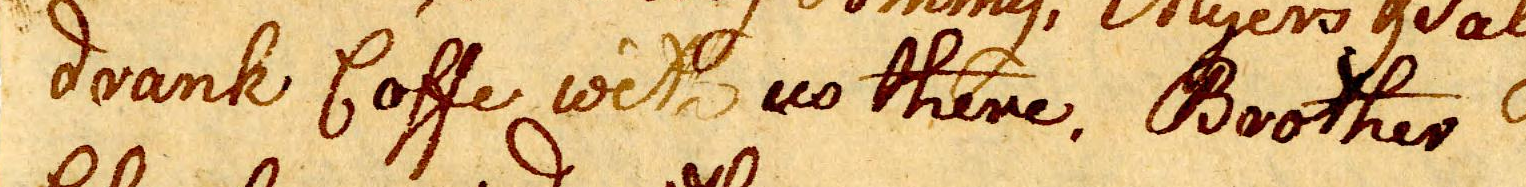drank Coffe with us there. Brother
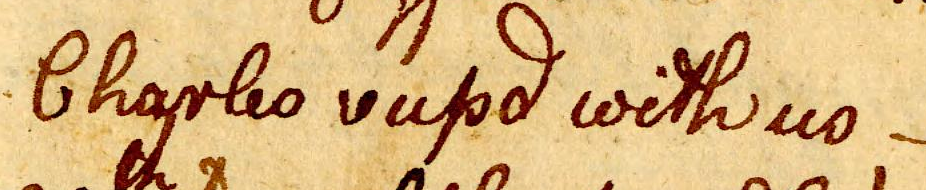Charles supd with us -
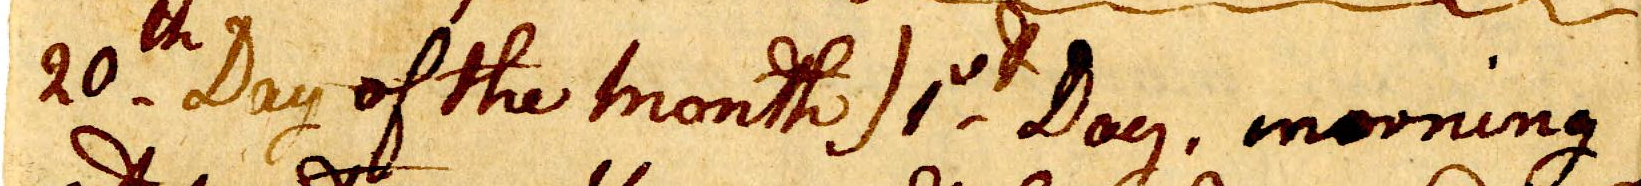20^th Day of the Month ) 1^st Day, morning
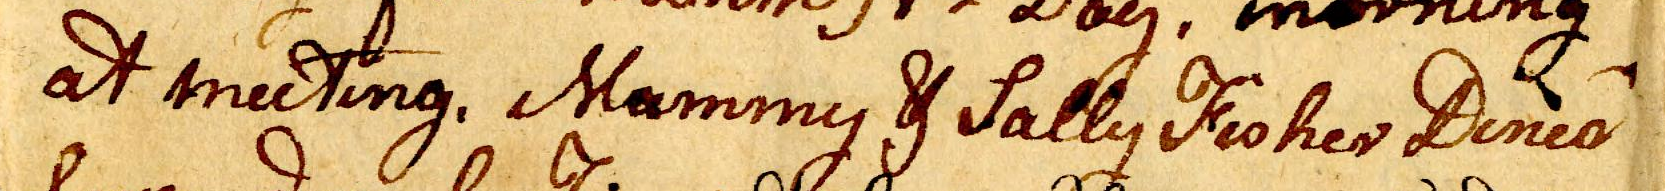at meeting, Mammy & Sally Fisher Dined
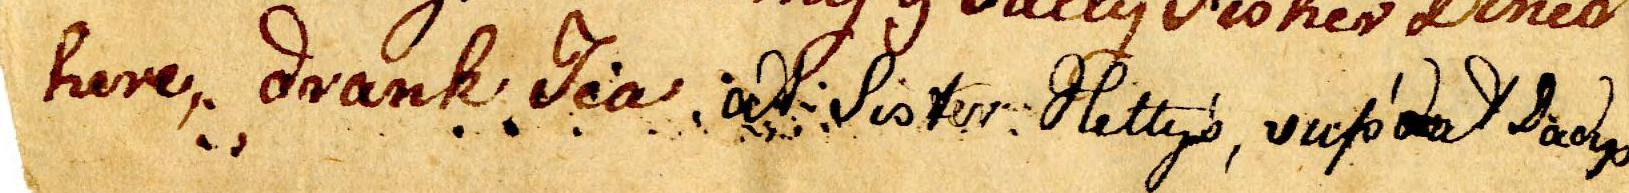here, drank Tea at Sister Hetty's, sup'd at Dadys
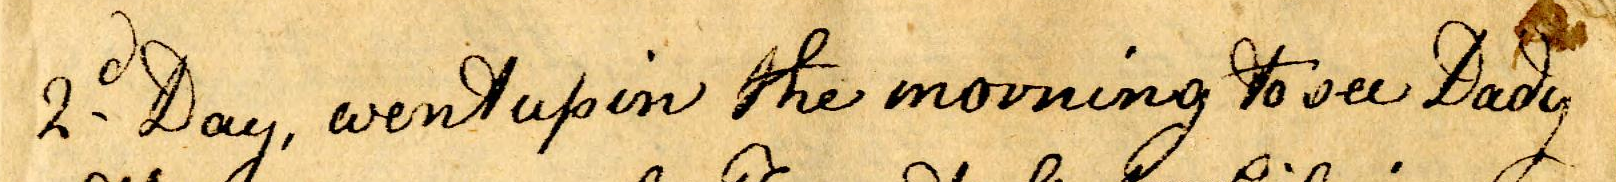2^d Day, went up in the morning to see Dady
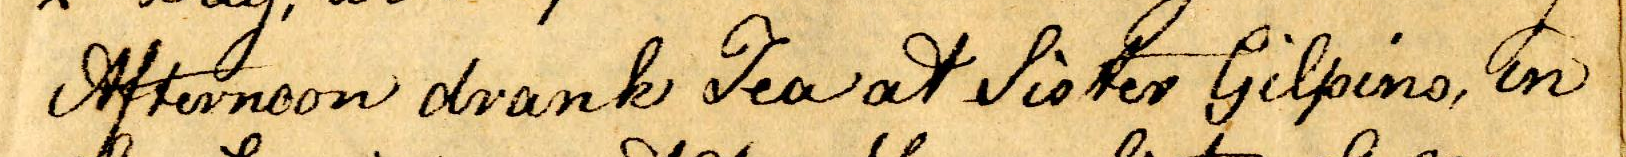Afternoon drank Tea at Sister Gilpins, in
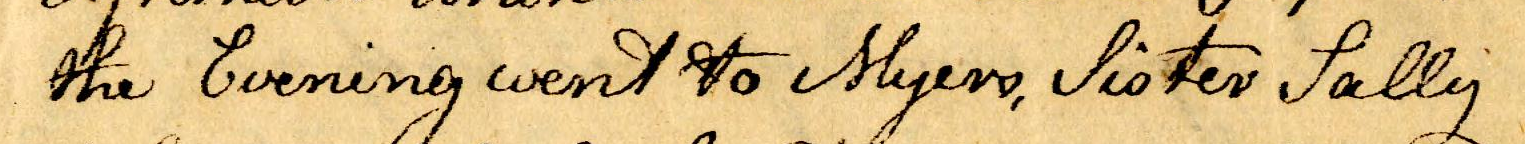the Evening went to Myers, Sister Sally
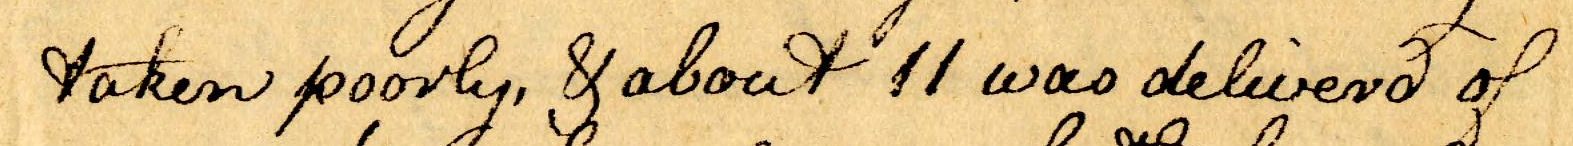taken poorly, & about 11 was delivered of
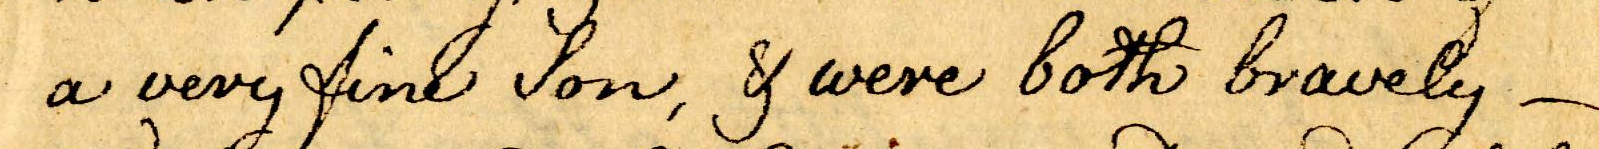a very fine Son, & were both bravely -
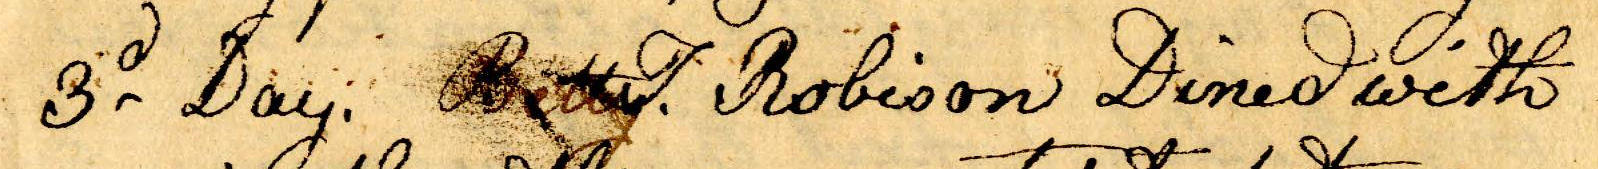3^d Day. [_____] T Robison Dined with
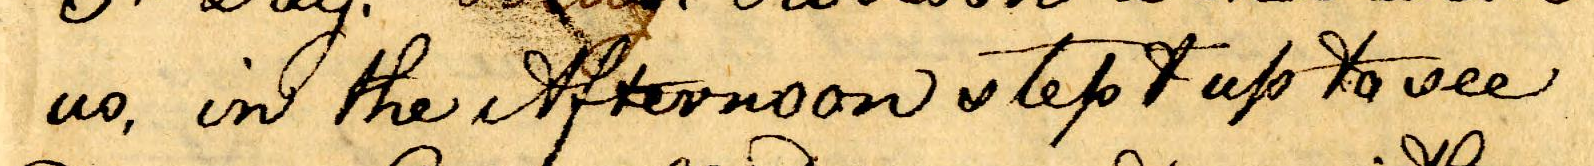us, in the Afternoon stept up to see
